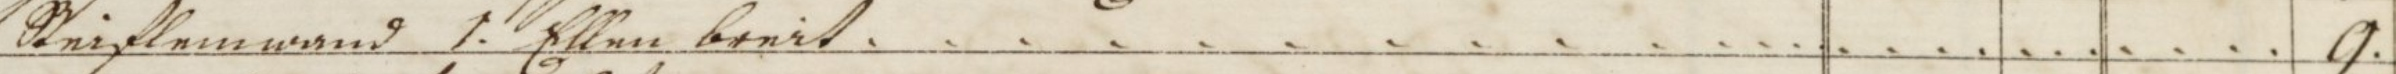Steifleinwand 1. Ellen breit. 9.
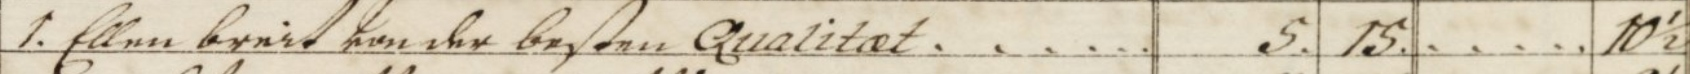1. Ellen breit von der besten Qualitæt. 5. 15. ... 10 1/2
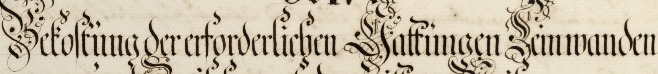Bekostung der erforderlichen Gattungen Leinwanden
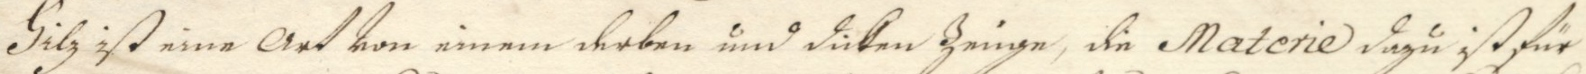Filz ist eine Art von einem derben und dicken Zeüge, die Materie dazu ist für
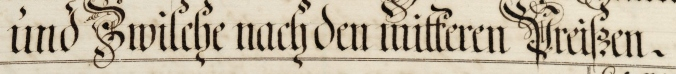und Zwilche nach den mitteren Preißen
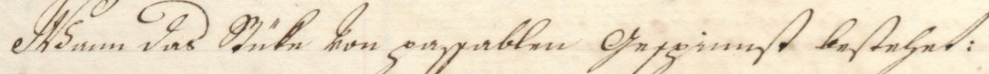Wann das Stüke von passablen Gespinnst bestehet:
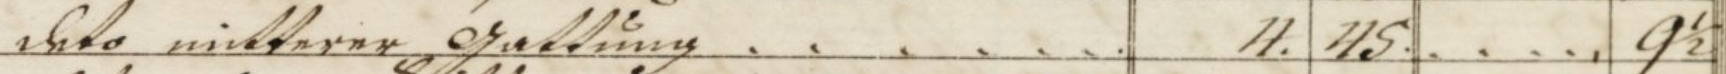deto mitterer Gattung. 4. 45. ... 9 1/2
